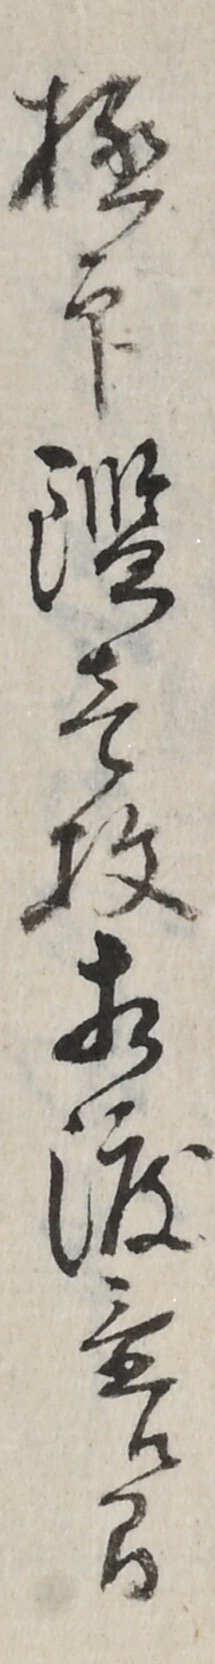極印鑑壱枚相渡置候間
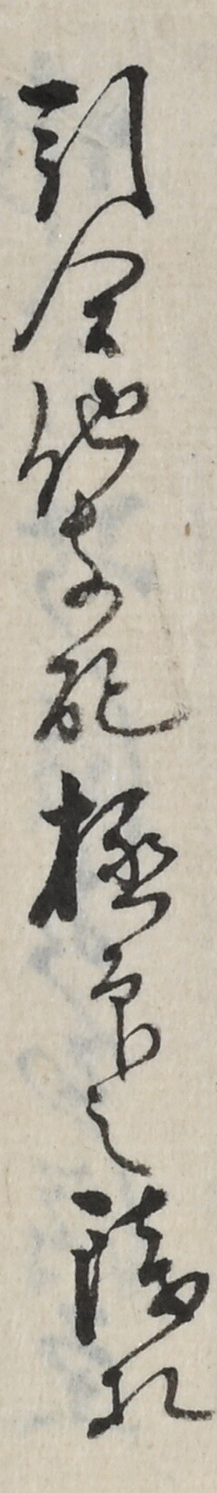引合他支配極印之銭札
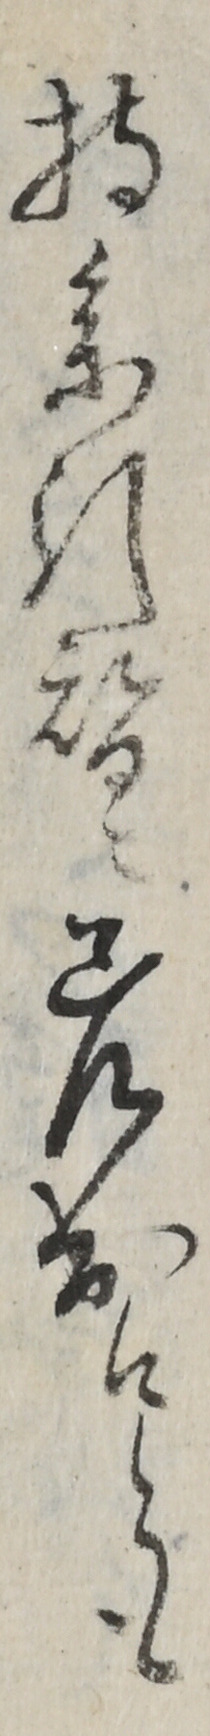持参引替ニ差出候とも

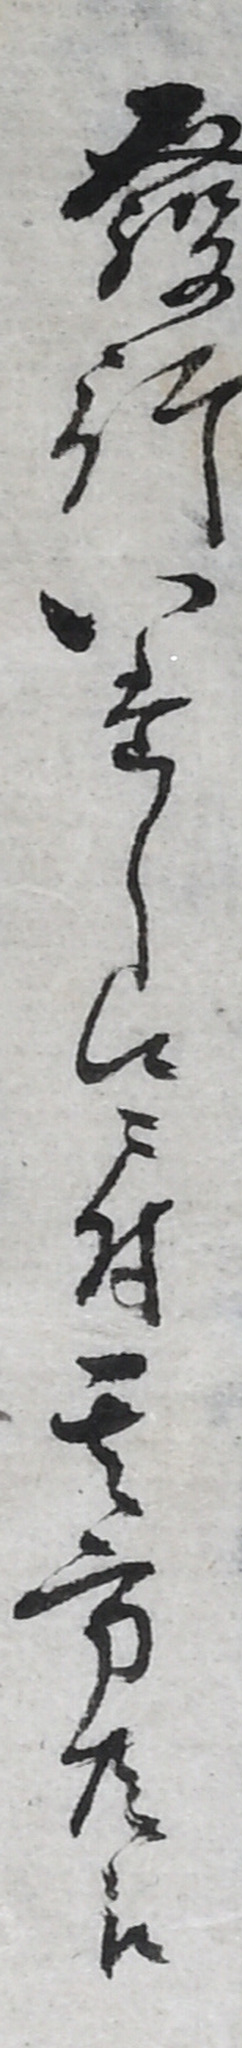発行いたし候ニ付其方共江
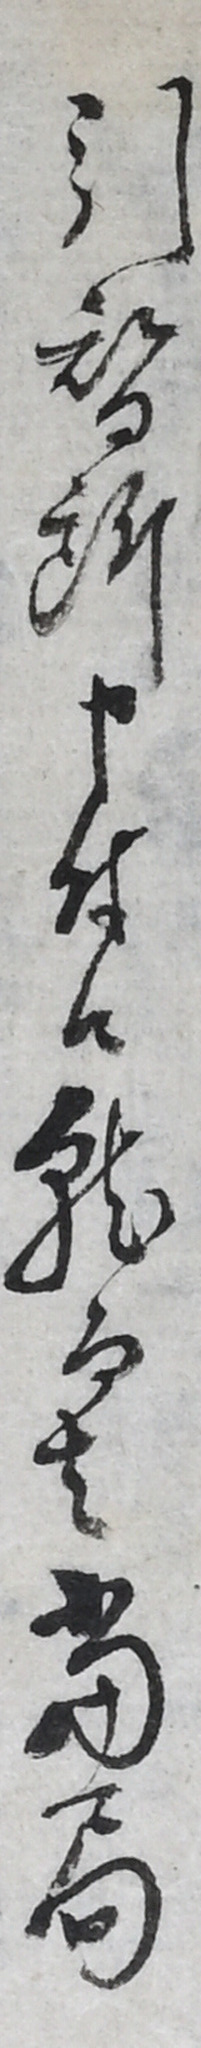引替所申付候就而者当局
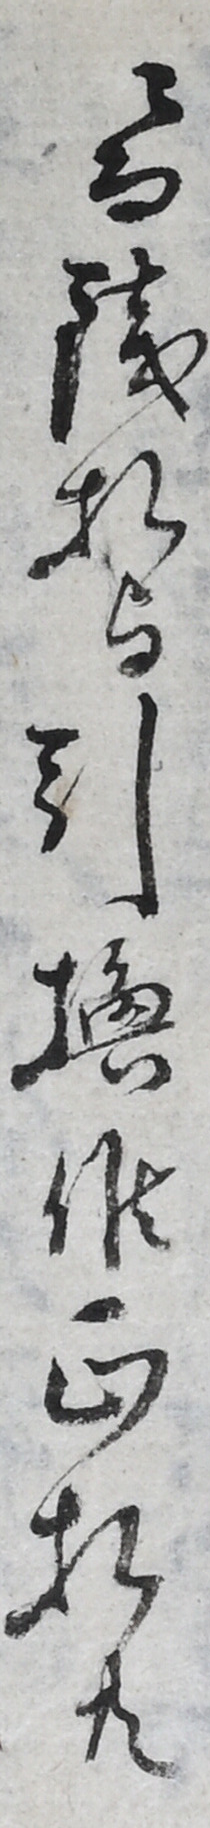ニ而銭札与引換候正札共
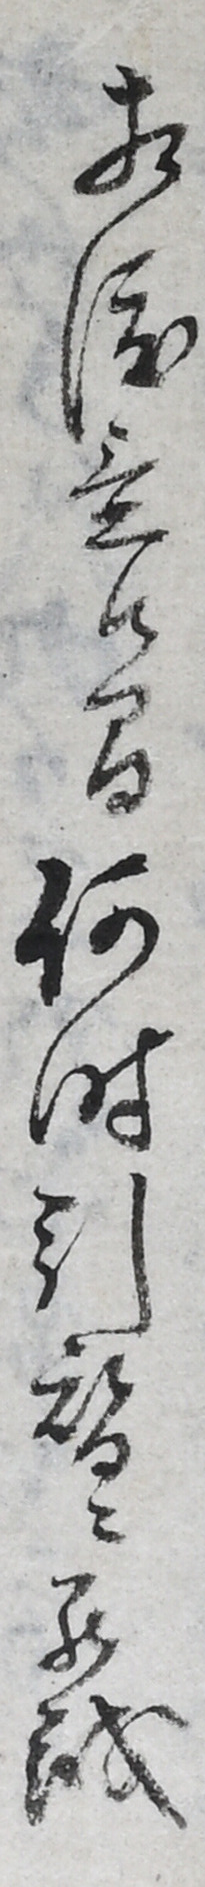相渡置候間何時引替ニ罷越
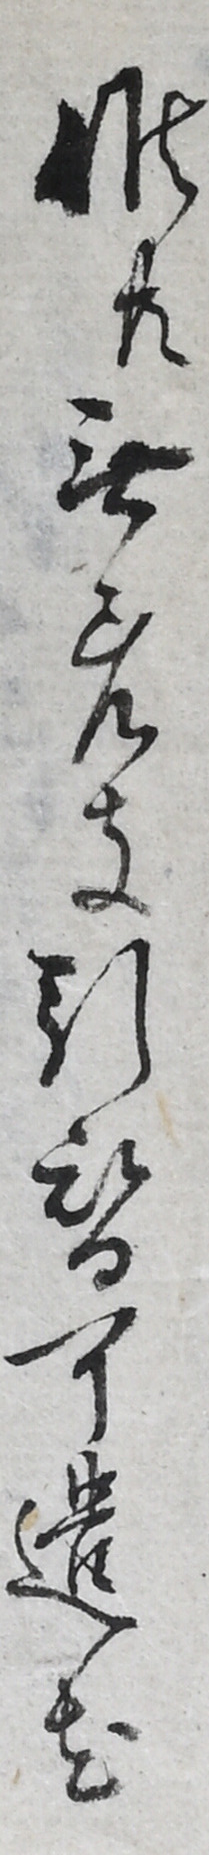候共無差支引替可遣尤
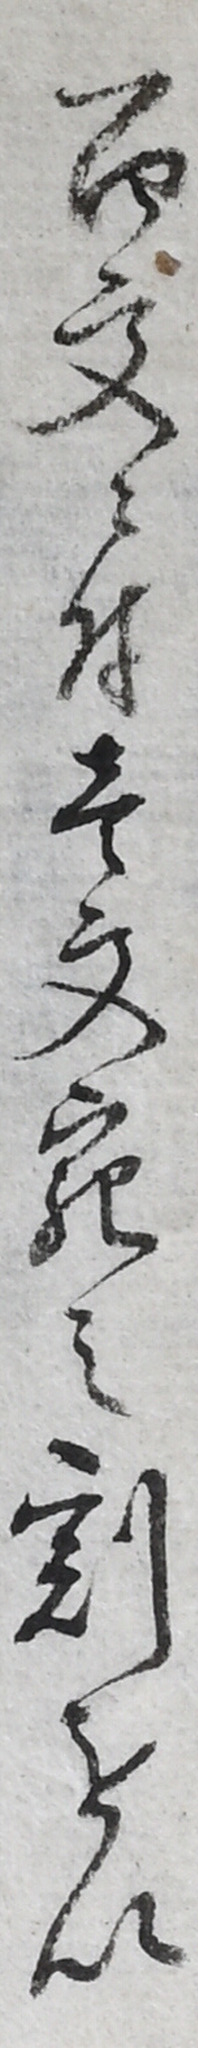百文ニ付壱文宛之割を以
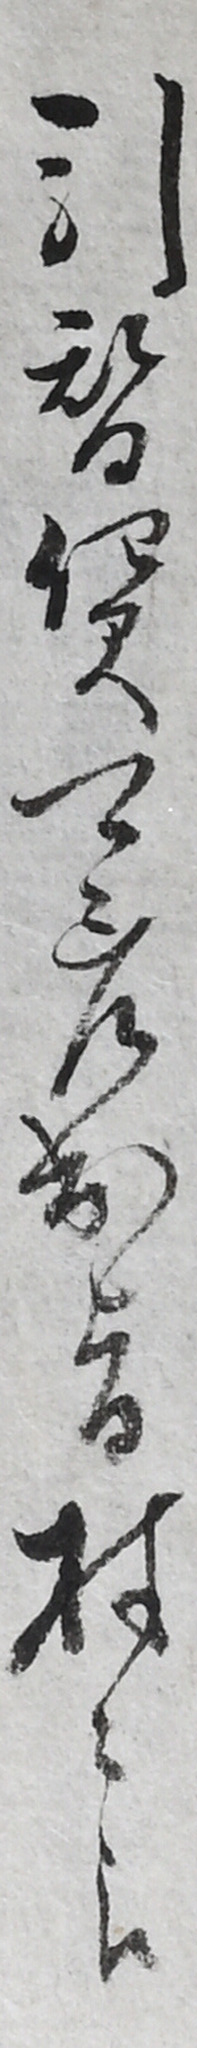引替賃可差出旨村々江
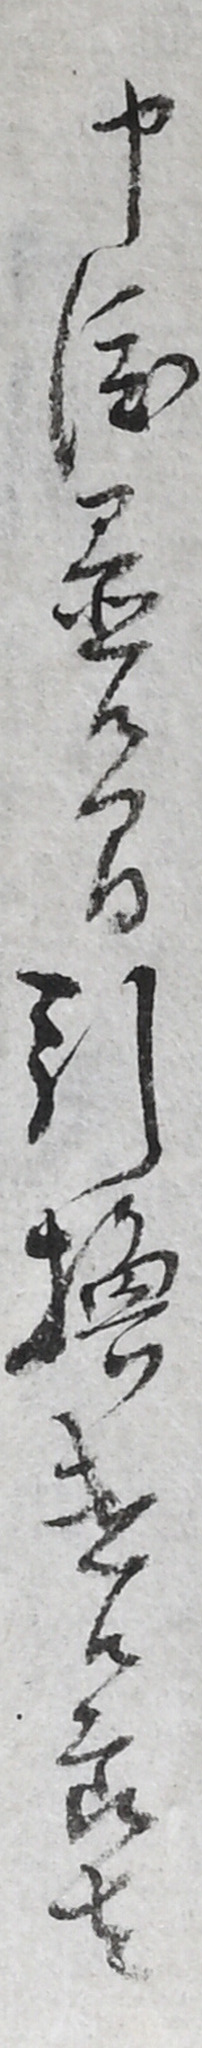申渡置候間引換遣候節者
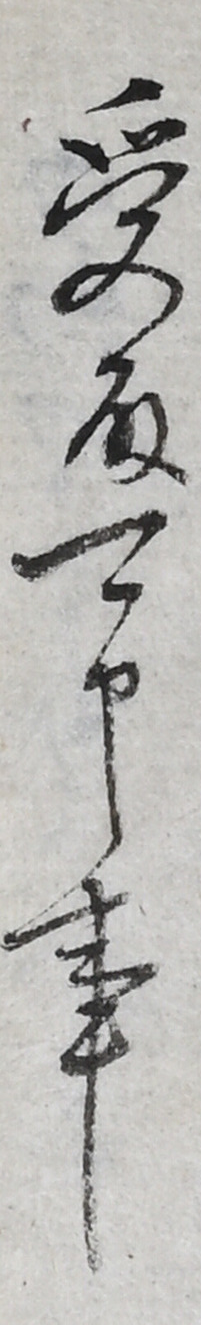受取可申事
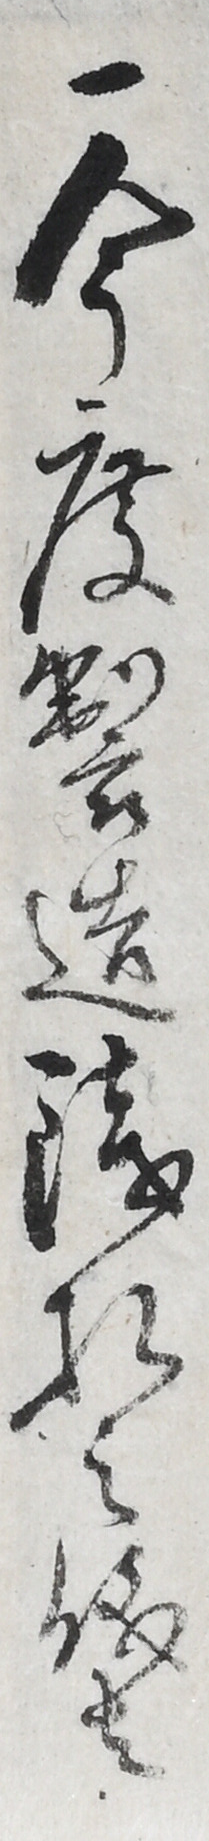一今度製造銭札之儀者
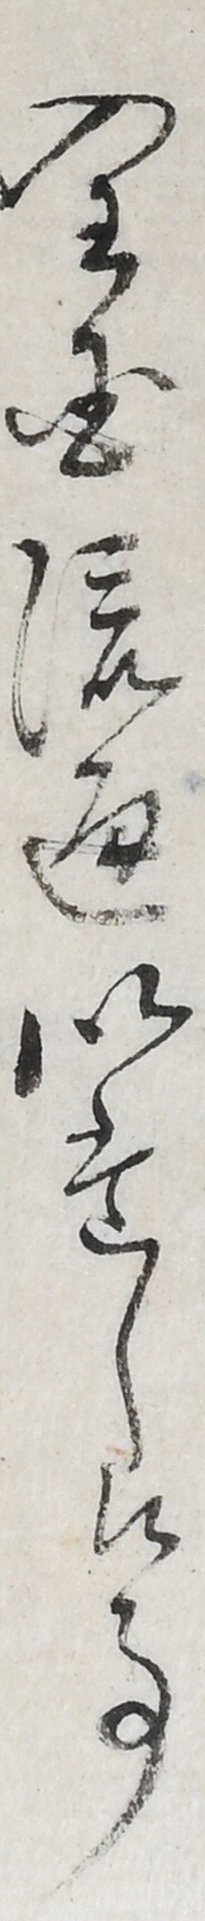金国流通いたし候事
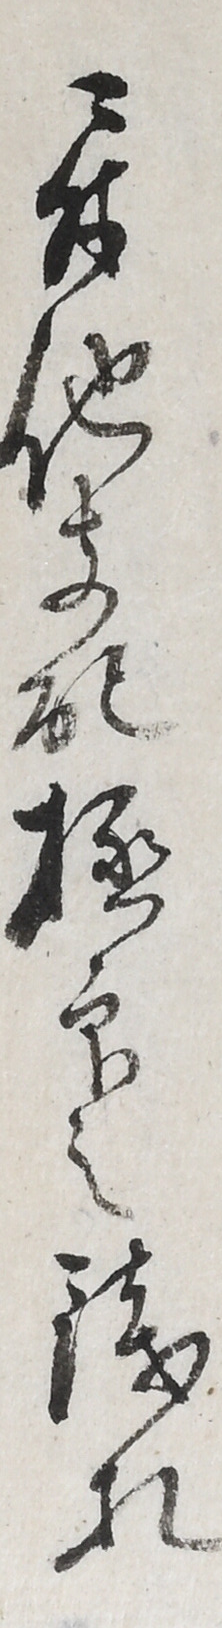ニ付他支配極印之銭札
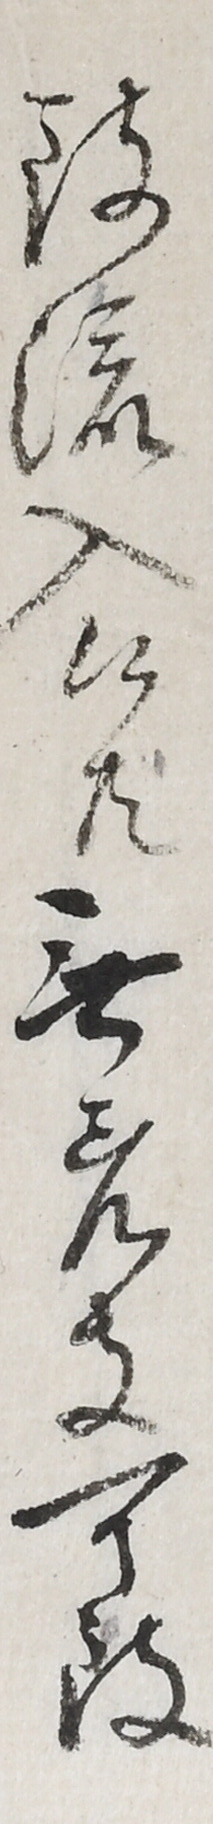致流入候共無差支可致
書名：信濃全國楮幣引換御用控
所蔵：伊那市立高遠町図書館・合同会社AMANE
